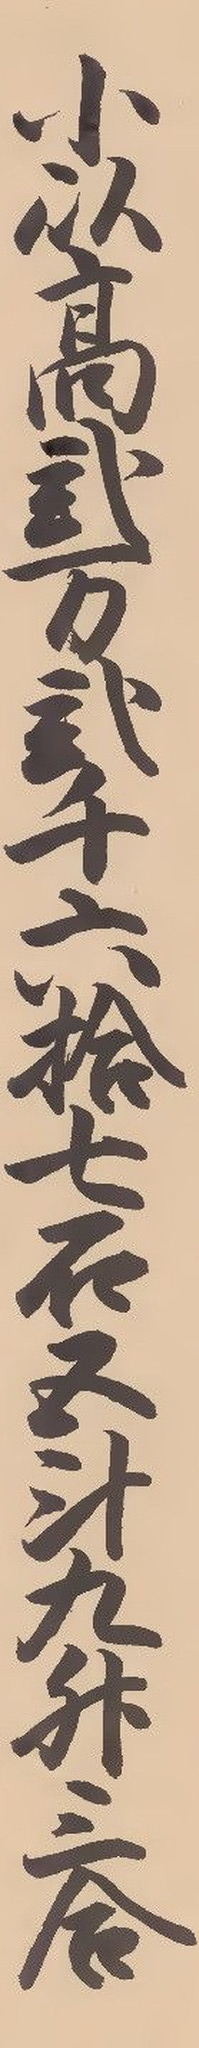小以高弐万弐千六拾七石五斗九升三合

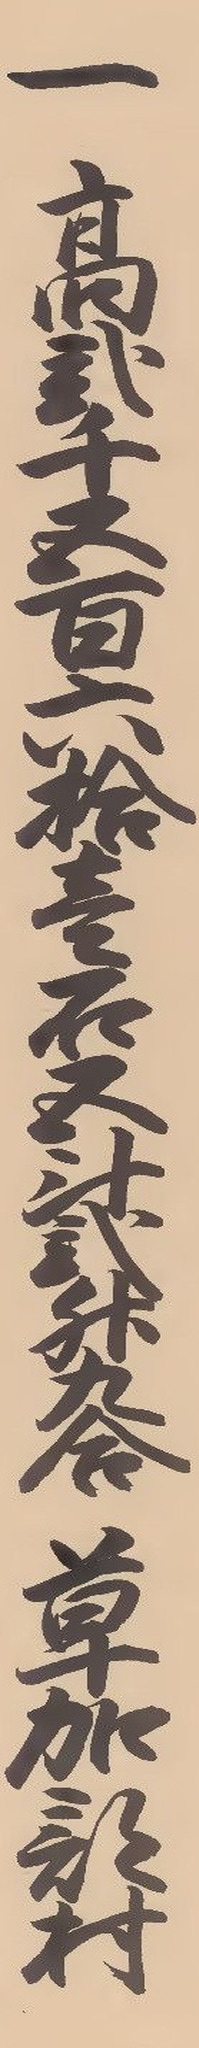一高弐千五百六拾壱石五斗弐升九合草加部村
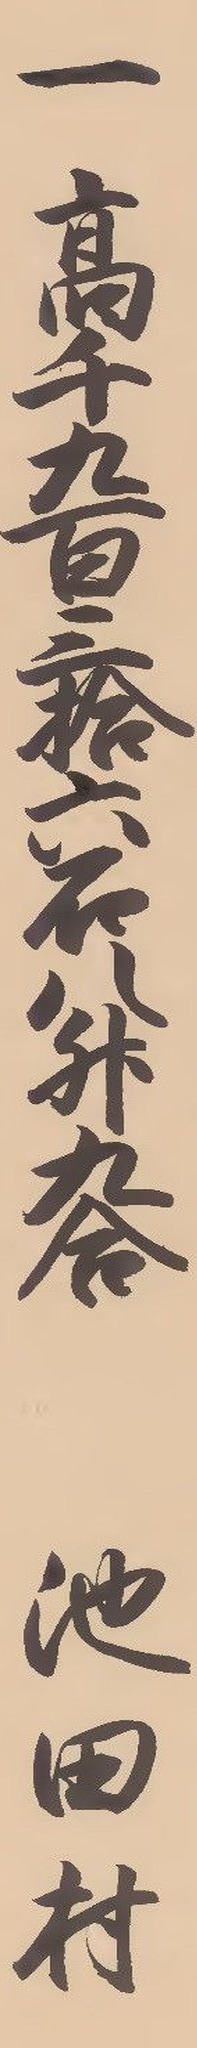一高千九百三拾六石八升九合池田村
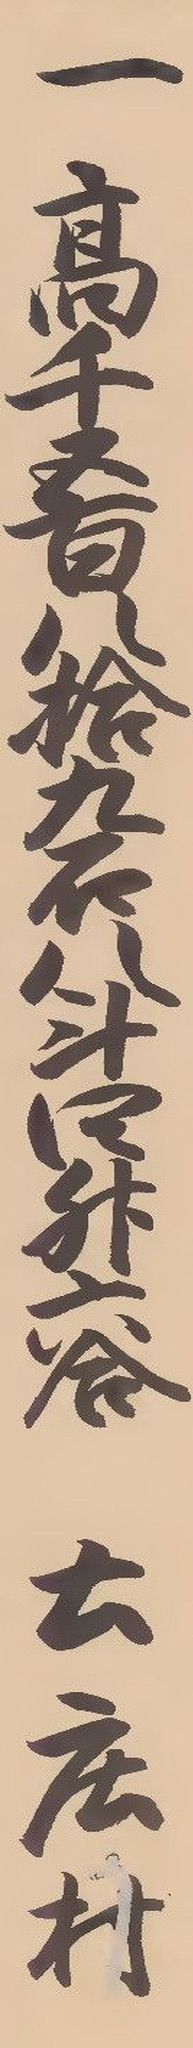一高千五百八拾九石八斗四升六合土庄村
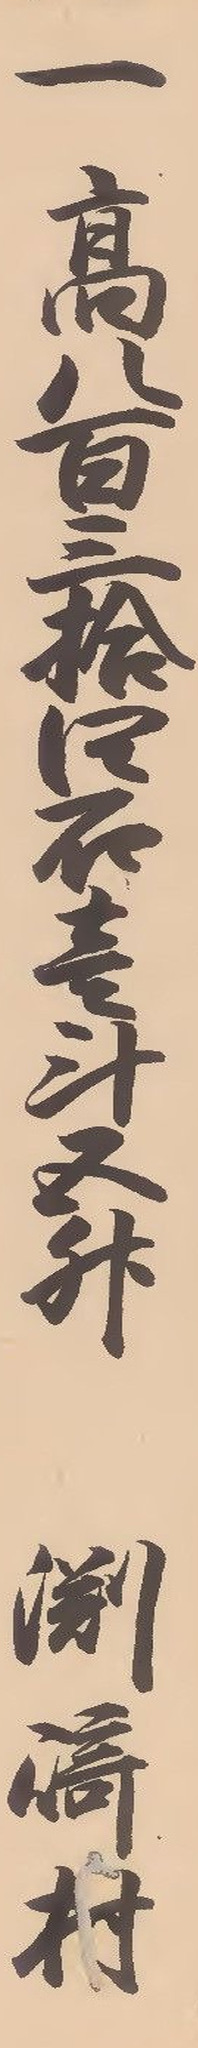一高八百三拾四石壱斗五升渕崎村
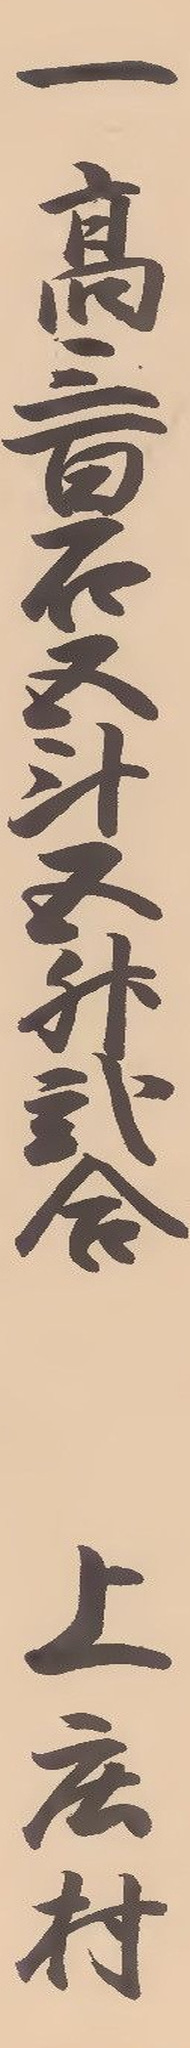一高三百石五斗五升弐合上庄村
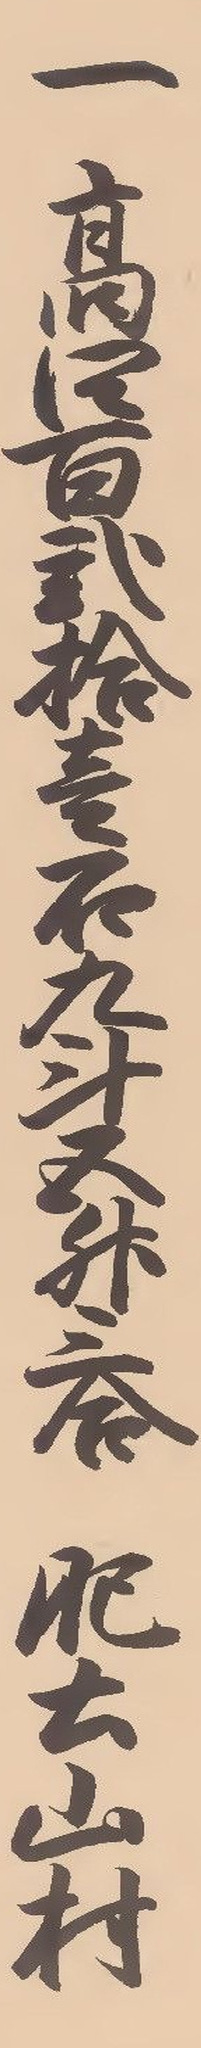一高四百弐拾壱石九斗五升三合肥土山村
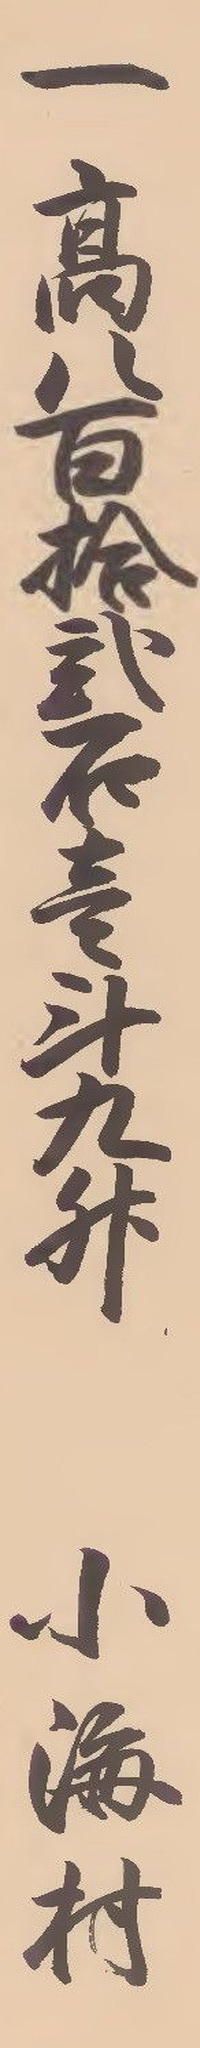一高八百拾弐石壱斗九升小海村

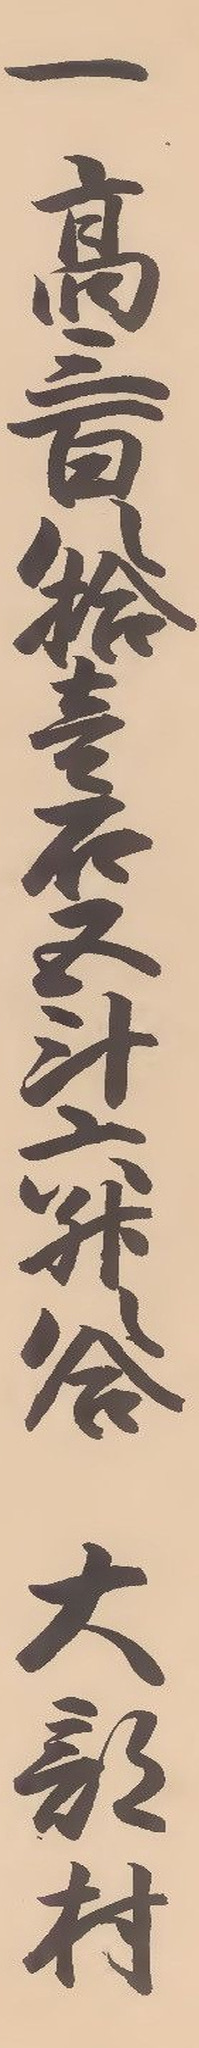一高三百八拾壱石五斗六升八合大部村
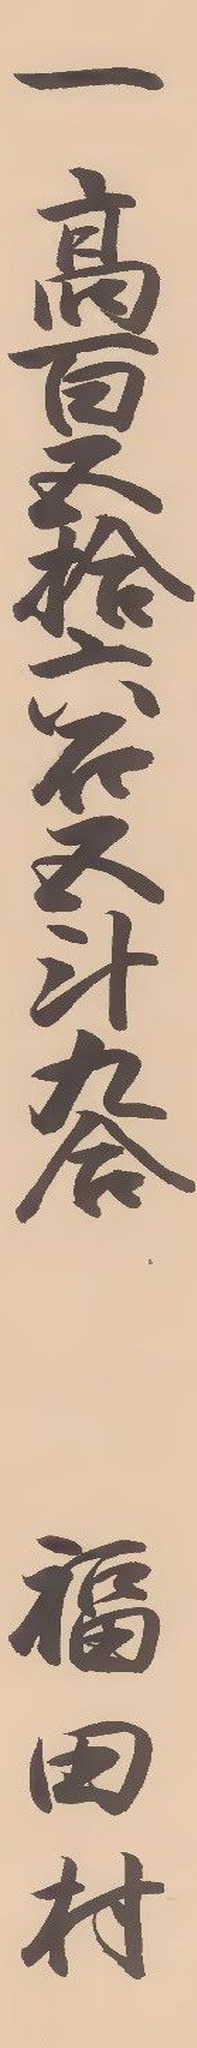一高百五拾六石五斗九合福田村
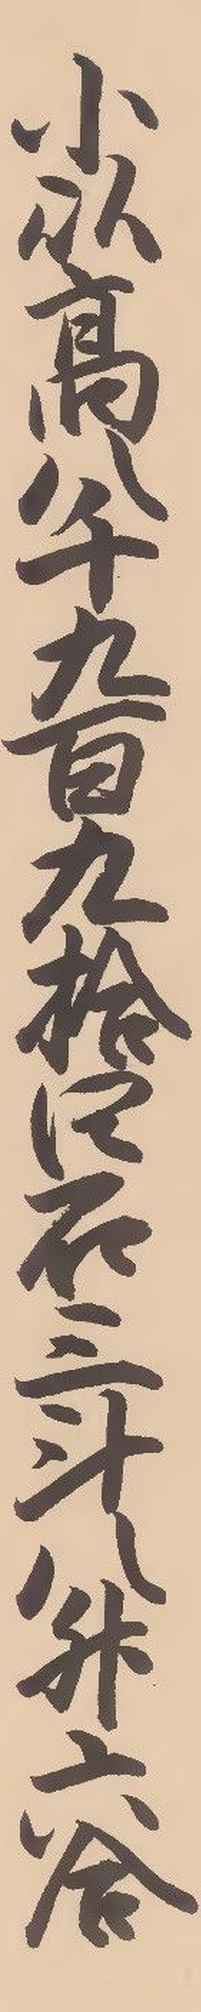小以高八千九百九拾四石三斗八升六合

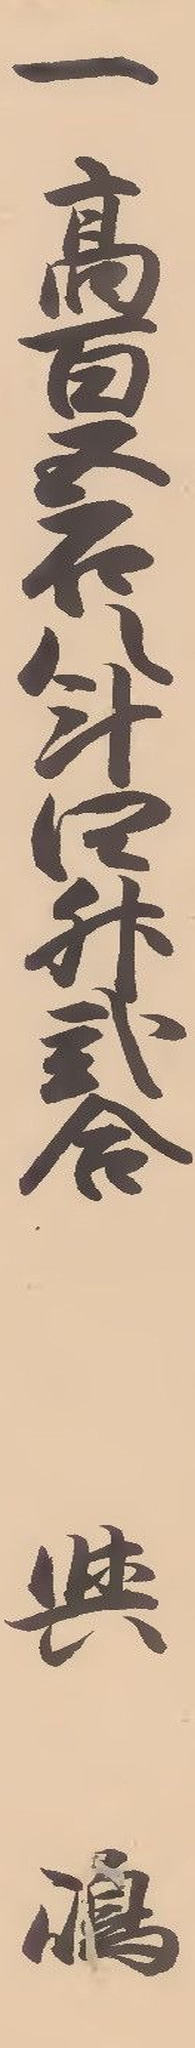一高百五石八斗四升弐合与島
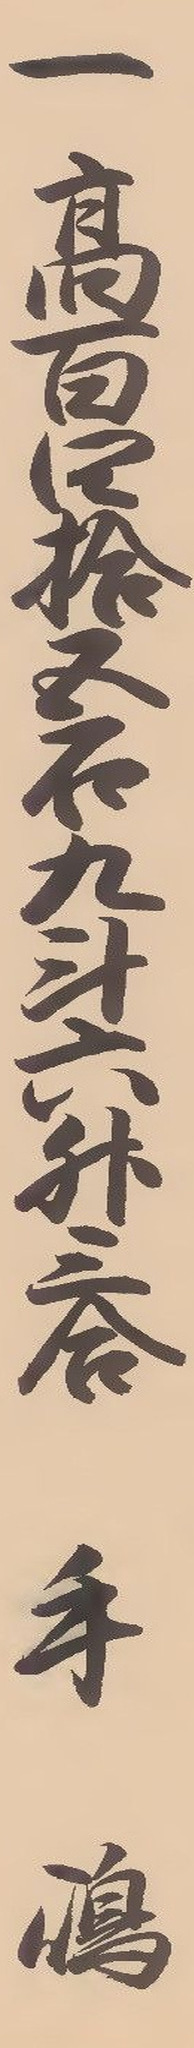一高百四拾五石九斗六升三合手島

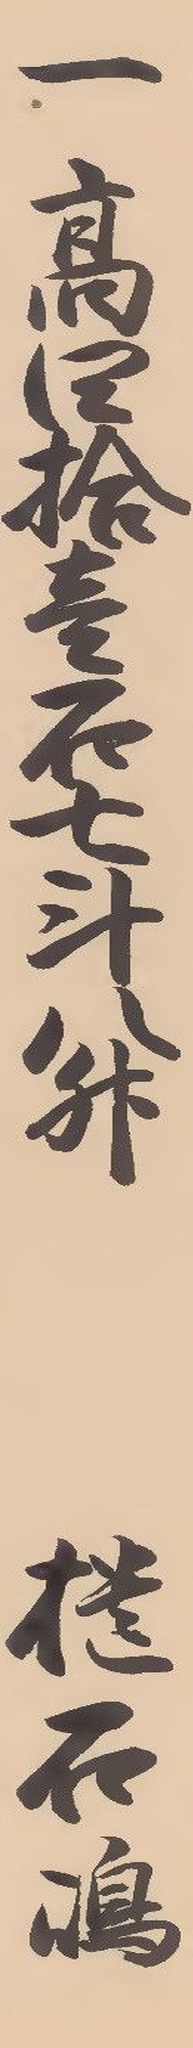一高四拾壱石七斗八升櫃石島
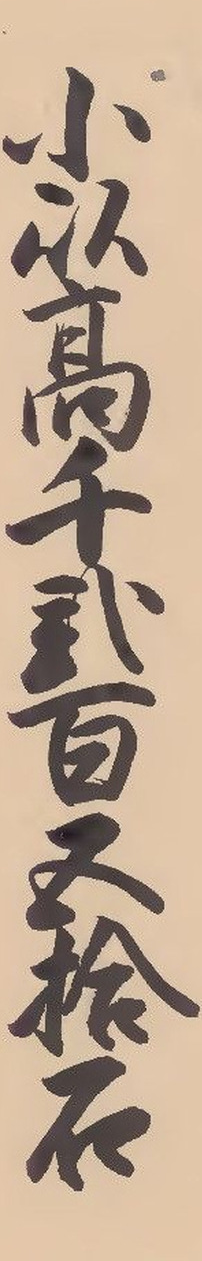小以高千弐百五拾石

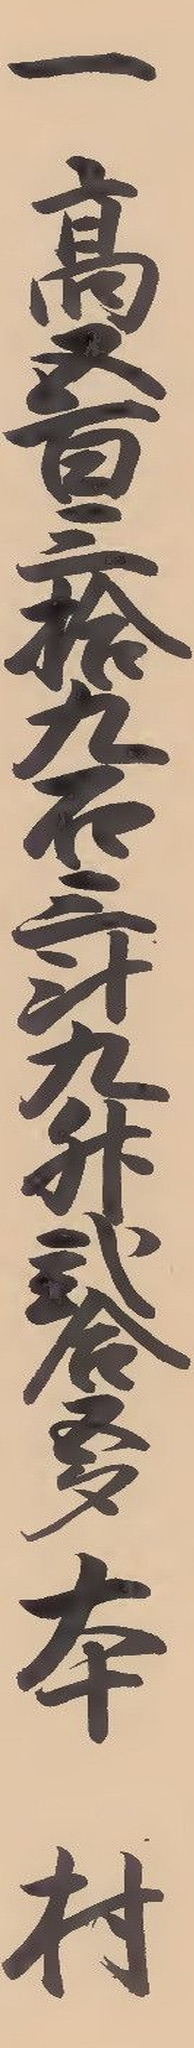一高五百三拾九石三斗九升弐合五勺本村
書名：讃岐国郷帳
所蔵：国立公文書館 National Archives of Japan
